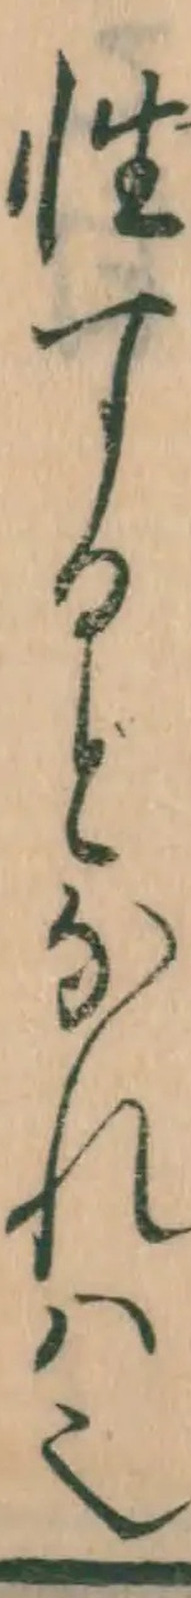性するどなれは也
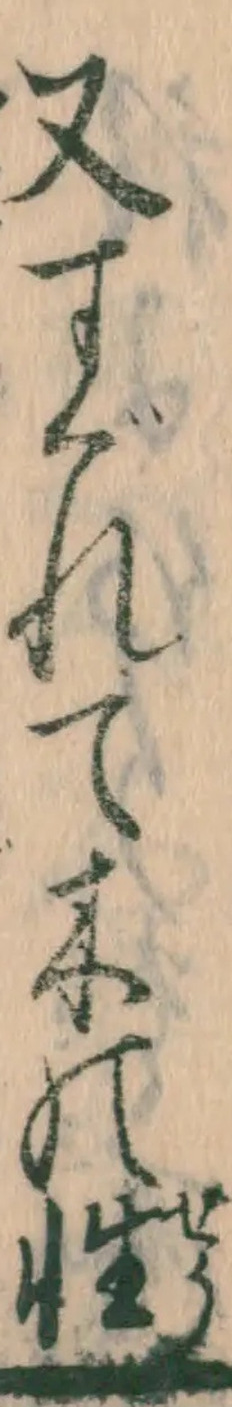又すぐれて木の性
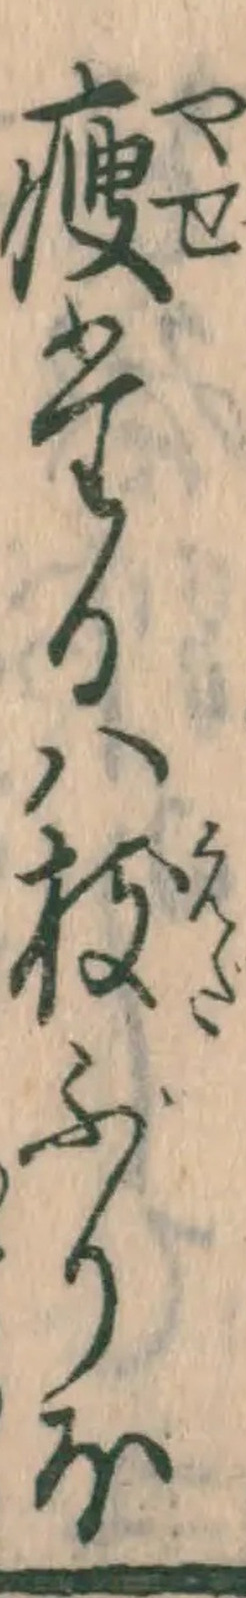痩たるは枝ぶりほ
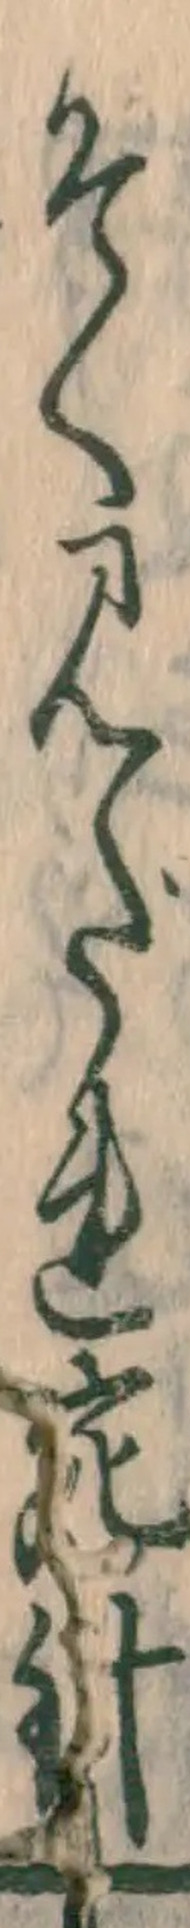そくみだれ宛針
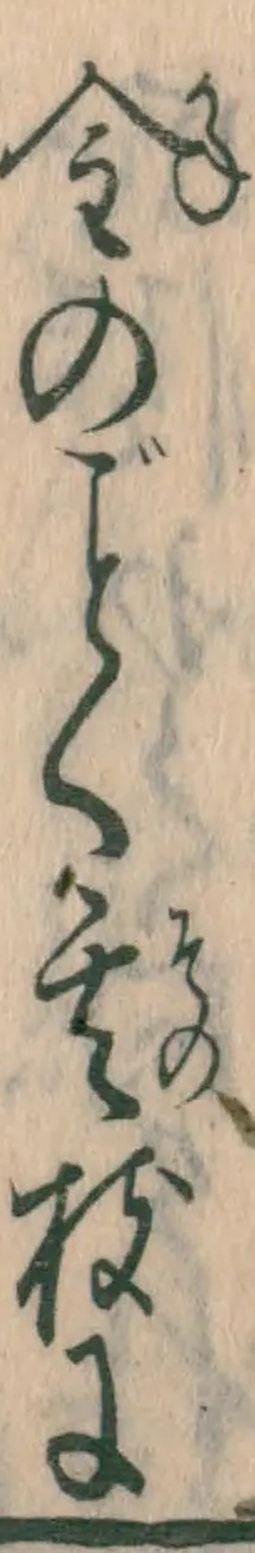金のごとく其枝に
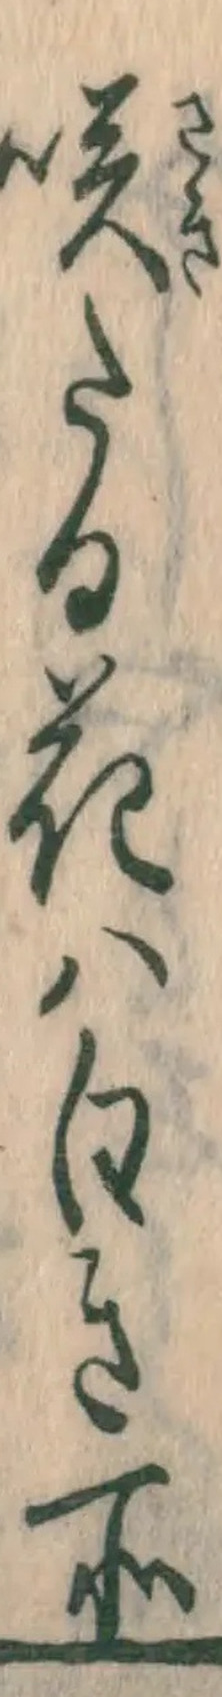咲たる花は白き所
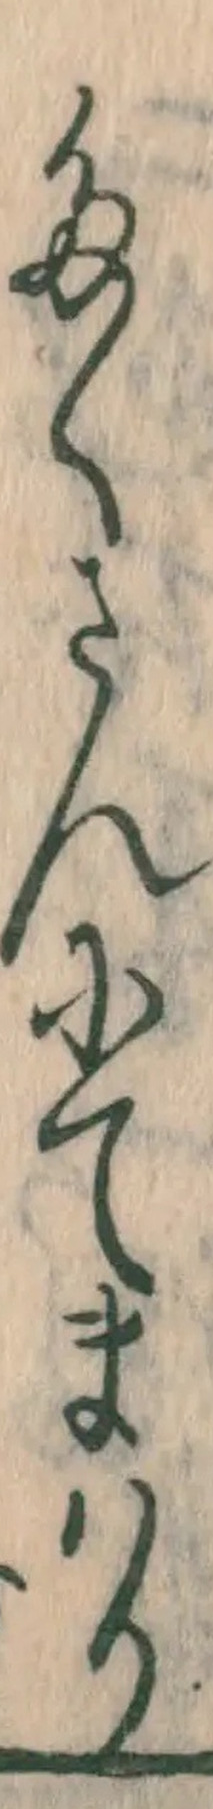たくさんにてまはり
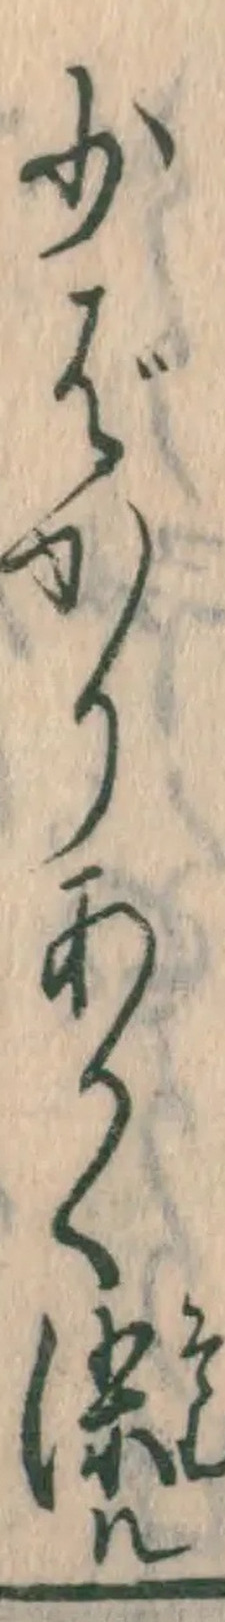少ばかりあかく染
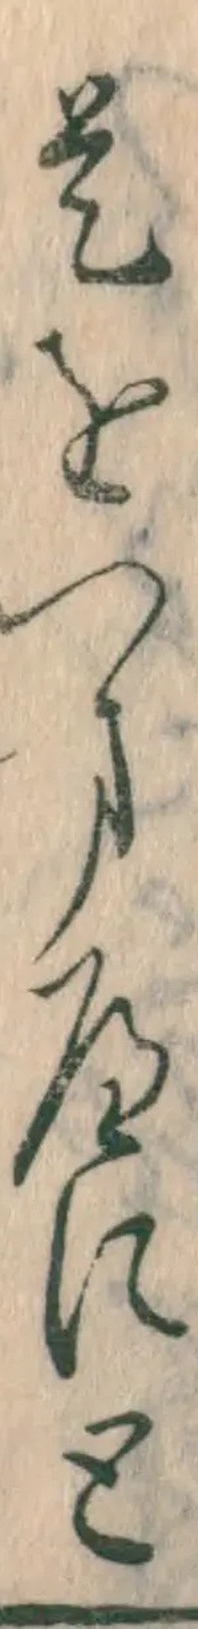是をつまへにと
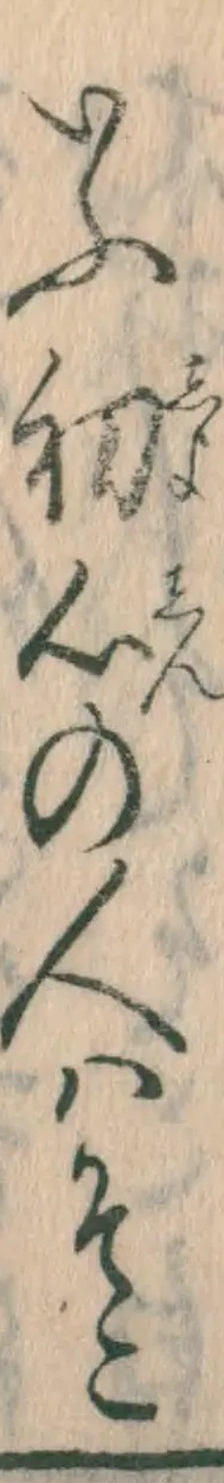いふ初心の人はそこ
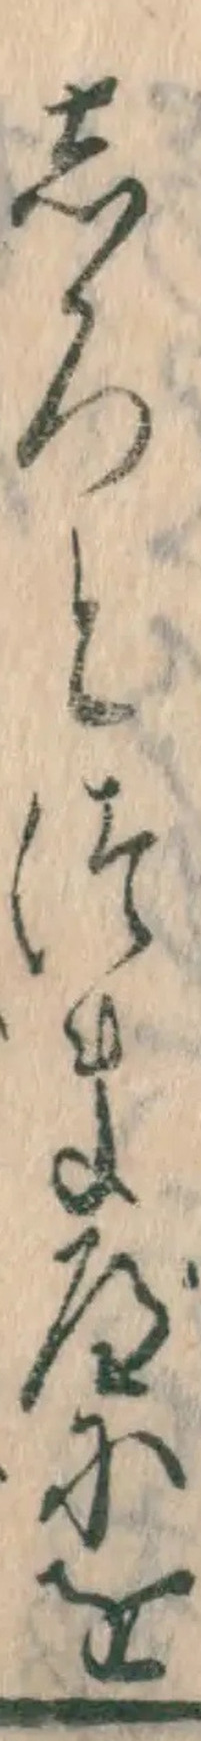しろとつまへにを
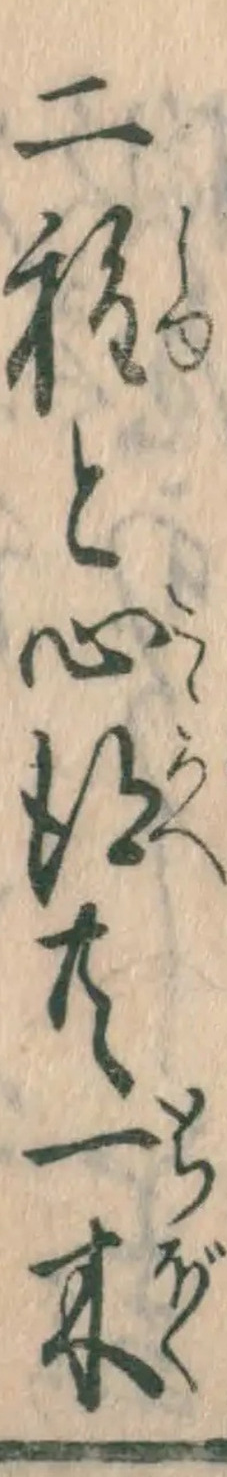二種と心得共一木
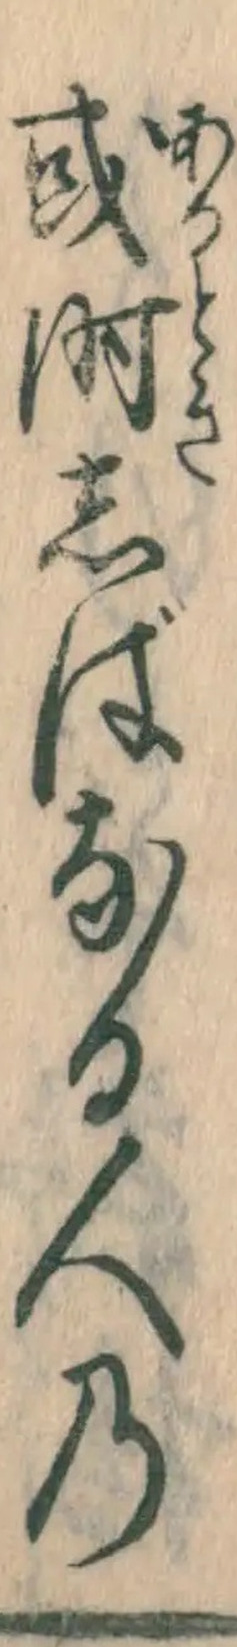或時しばなる人の

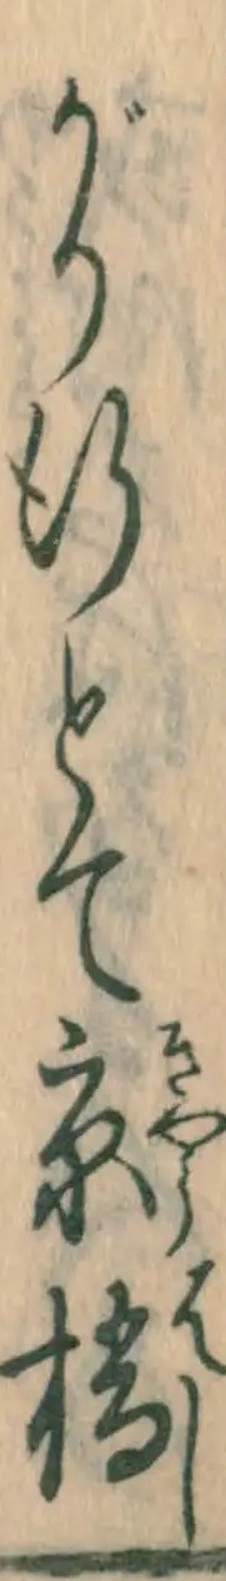がり行とて京橋
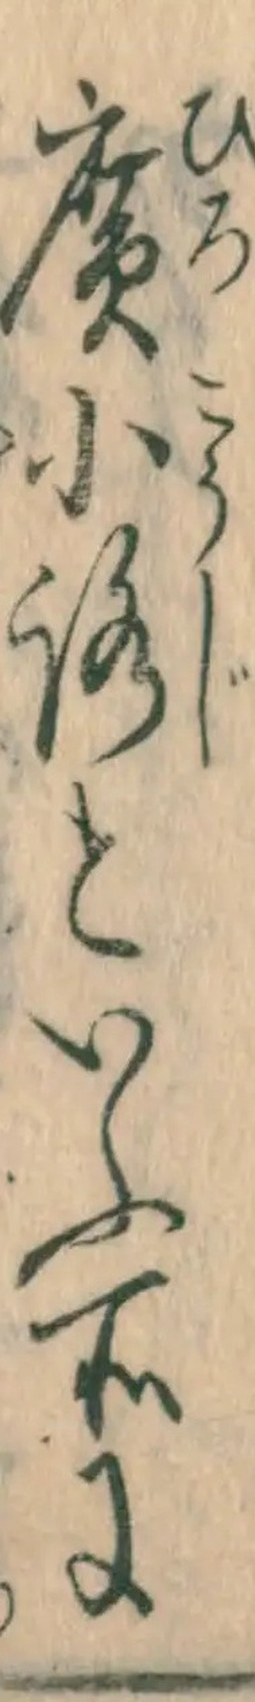廣小路といふ所に
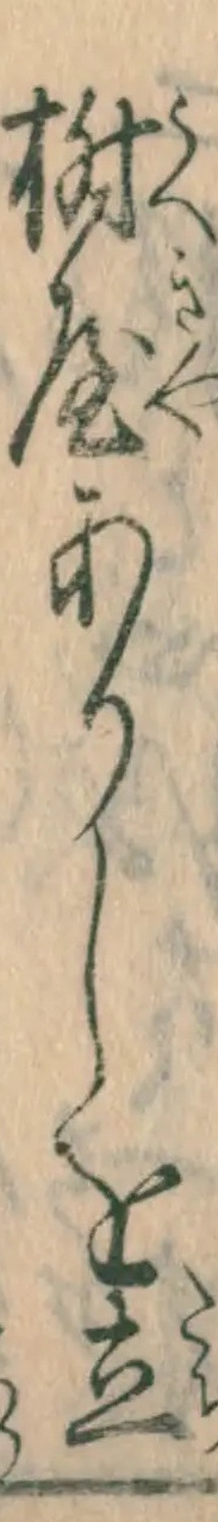樹屋ありしを立
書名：錦繍枕 5巻. [4]
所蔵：国立国会図書館 National Diet Library, JAPAN
